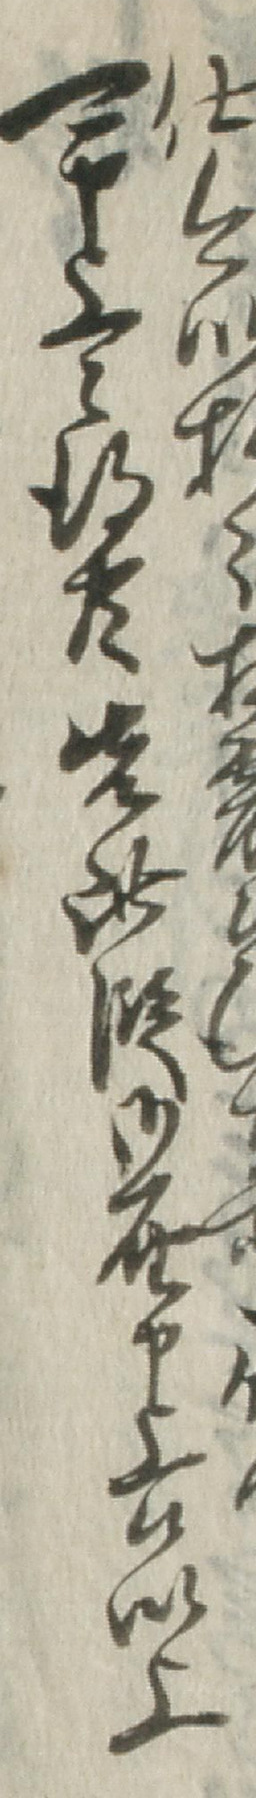可申上候得共先此段御届申上候以上
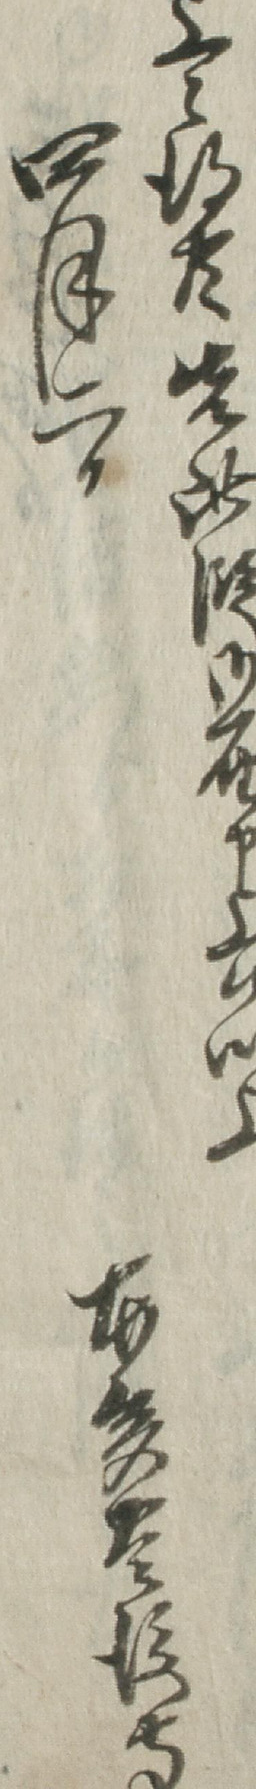四月二日本多豊後守
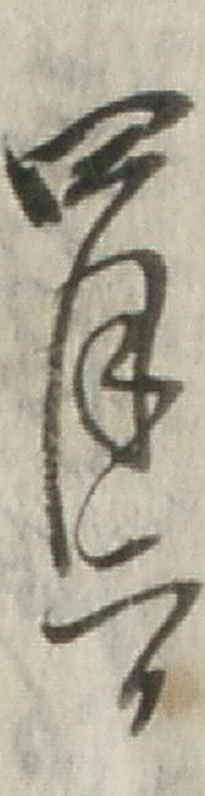四月二日
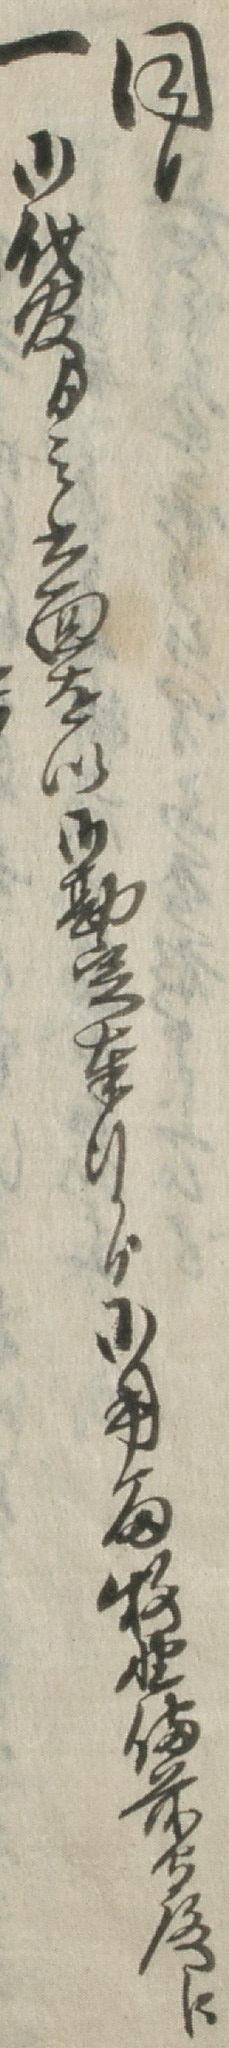一御代官所ゟ之書面を以御勘定奉行ゟ御用番牧野備前守殿江
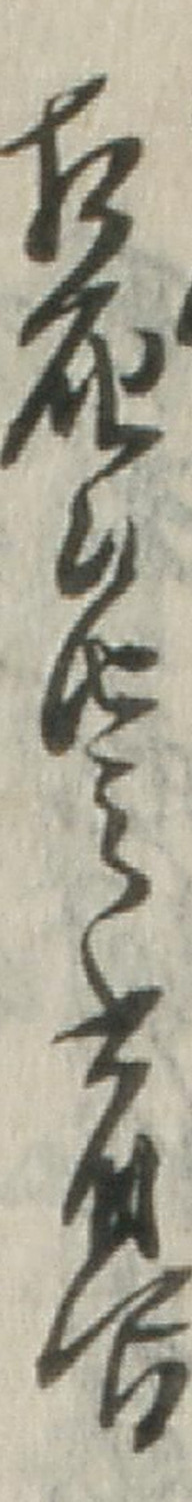相届候由之書付写
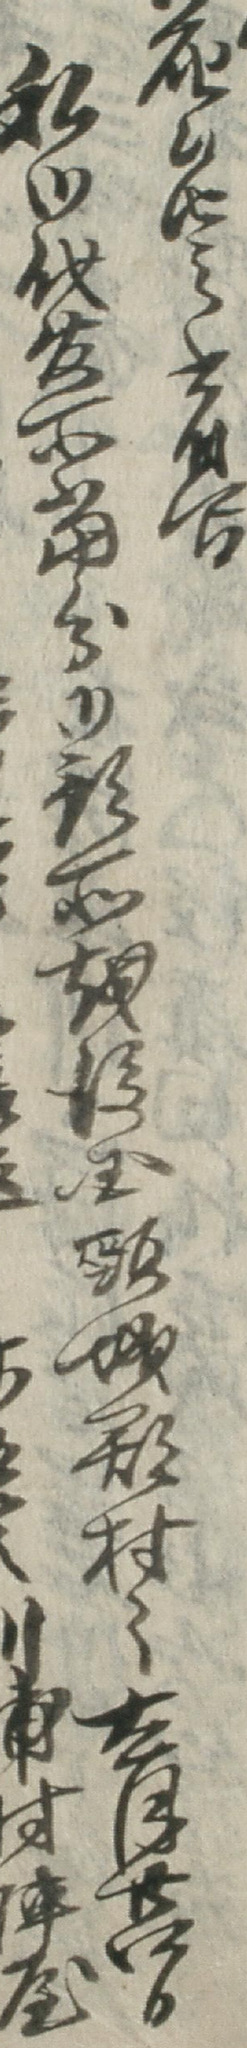私御代官所当分御預所越後国頸城郡村々去月廿四日
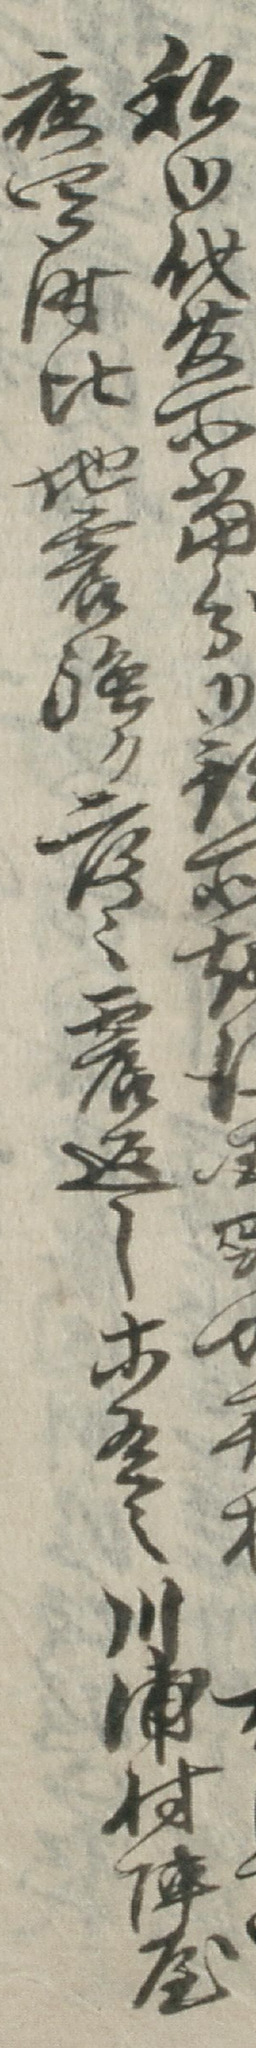四ッ時比地震強ク度々震返し等有之川浦村陣屋
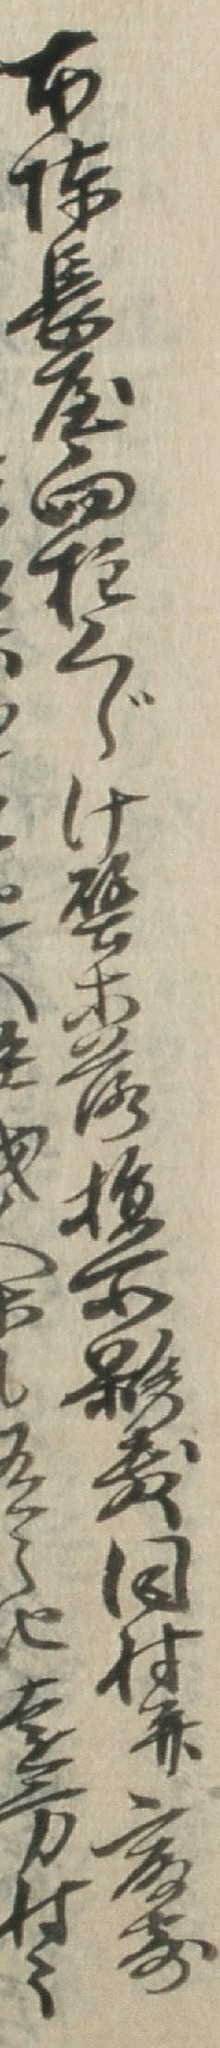長屋向柱くじけ壁等落損所夥敷同村并最寄
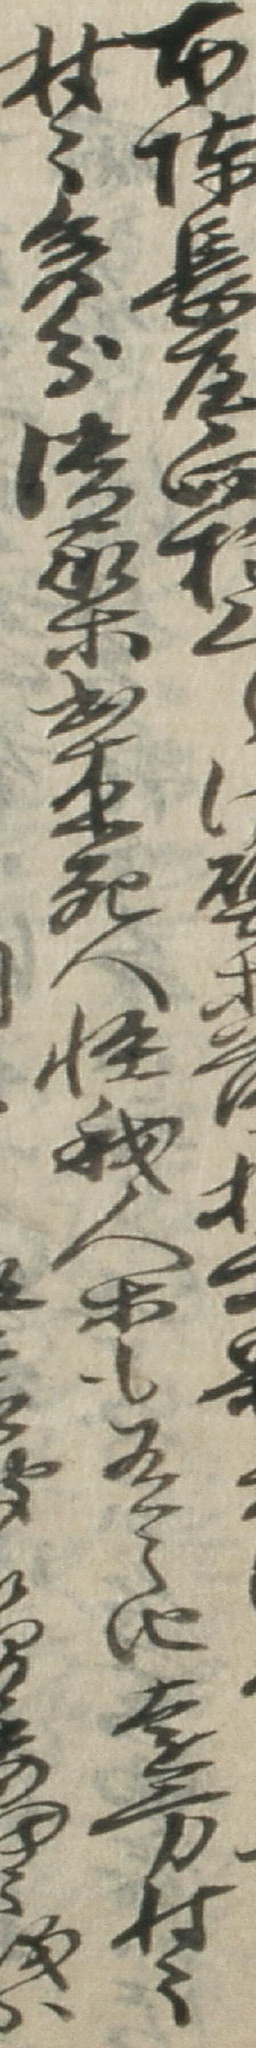村々多分潰家等出来死人怪我人等も有之由遠方村々
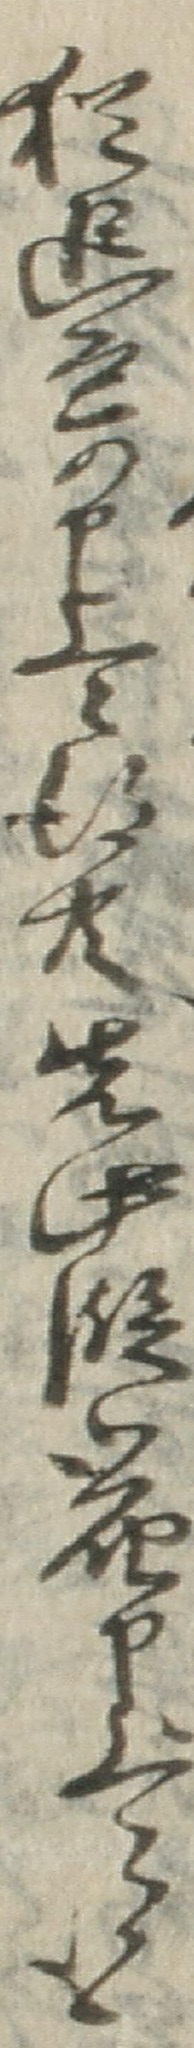可申上候得共先此段御届申上候以上
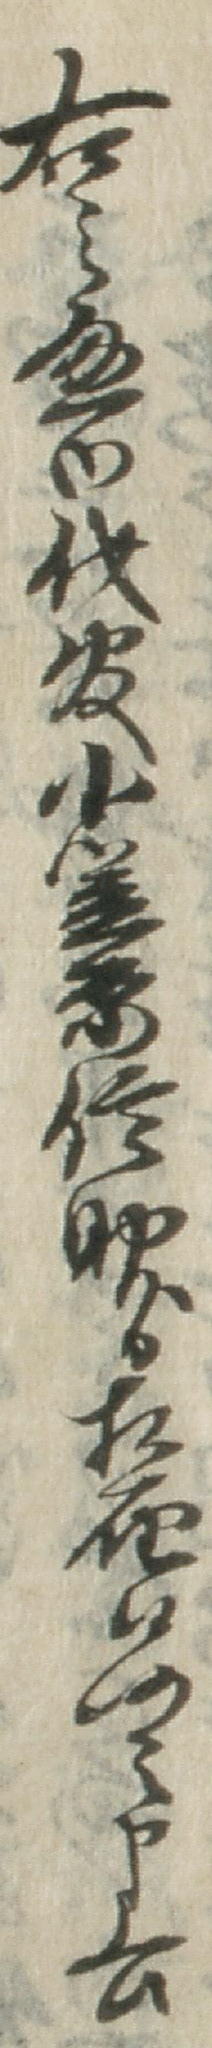右之通御代官小笠原信助ゟ相届候仍之申上候
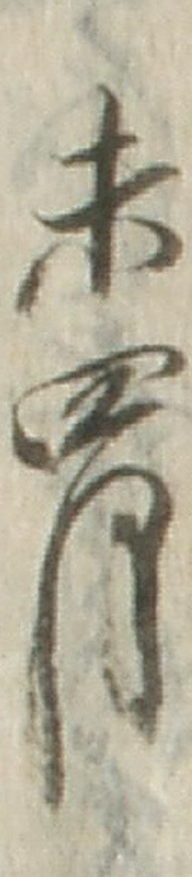未四月
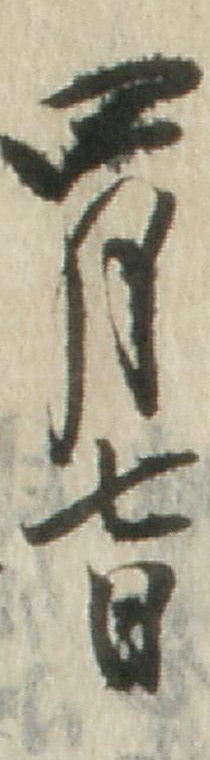四月二日
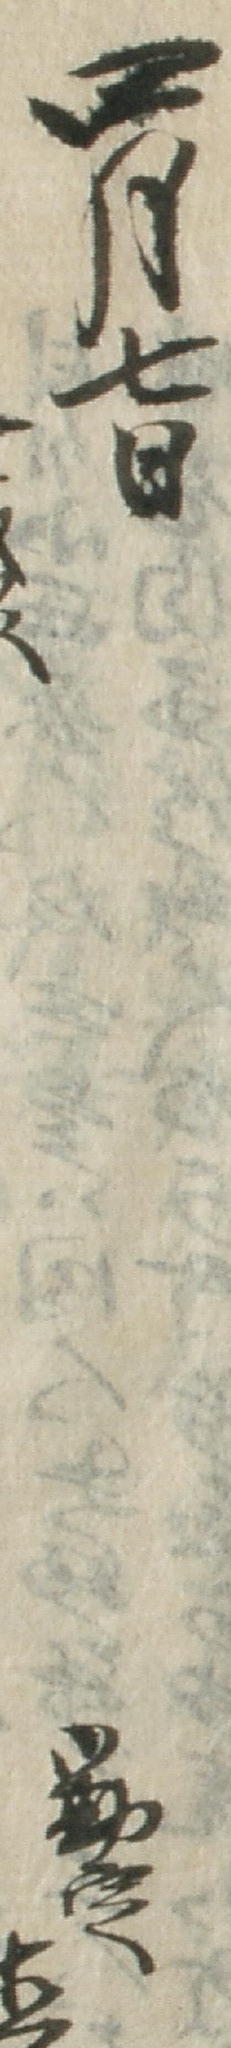四月七日勘定
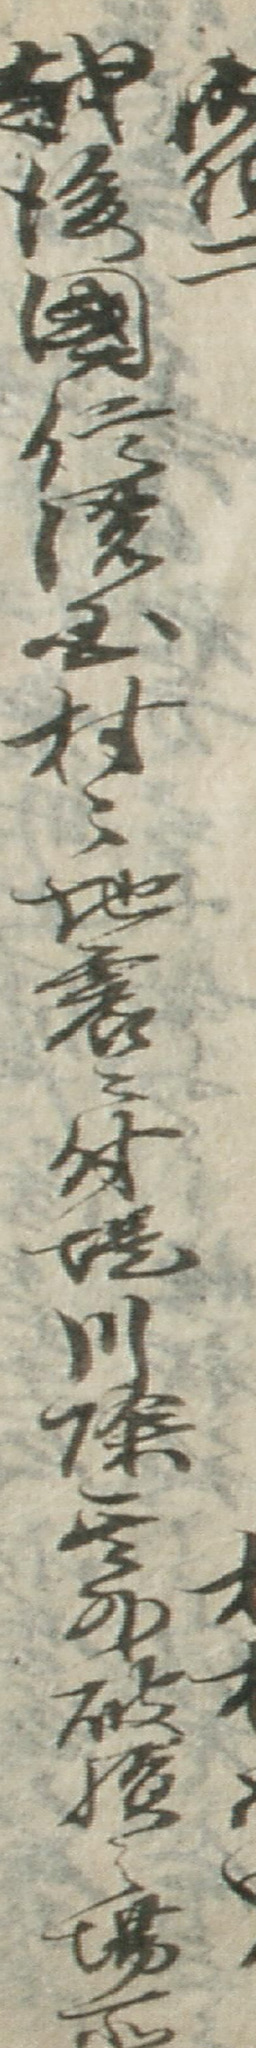越後国信濃国村々地震二付川除其外破損之場所
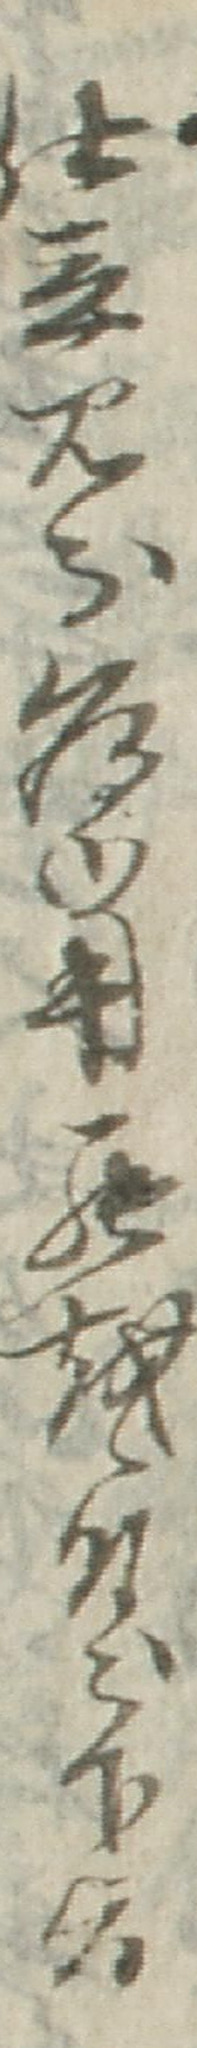仕立見分為御用罷越候付被下旨
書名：信濃國地震實録記
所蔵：東京大学地震研究所図書室 Earthquake Research Institute Library, The University of Tokyo, JAPAN
